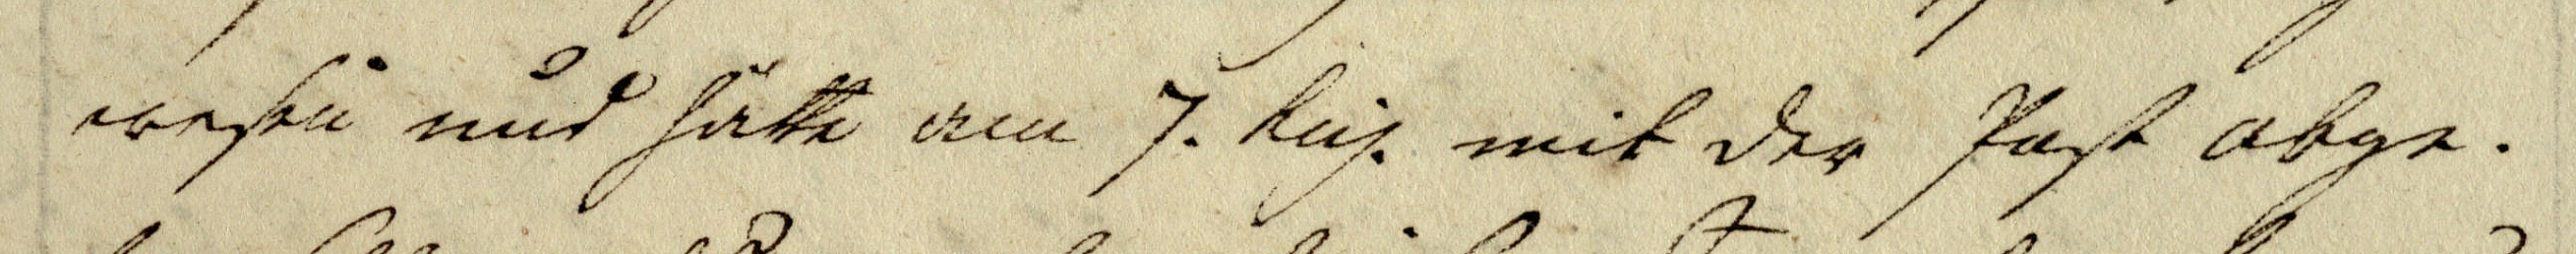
wesen und hätte am 7. huj. mit der Post abge¬
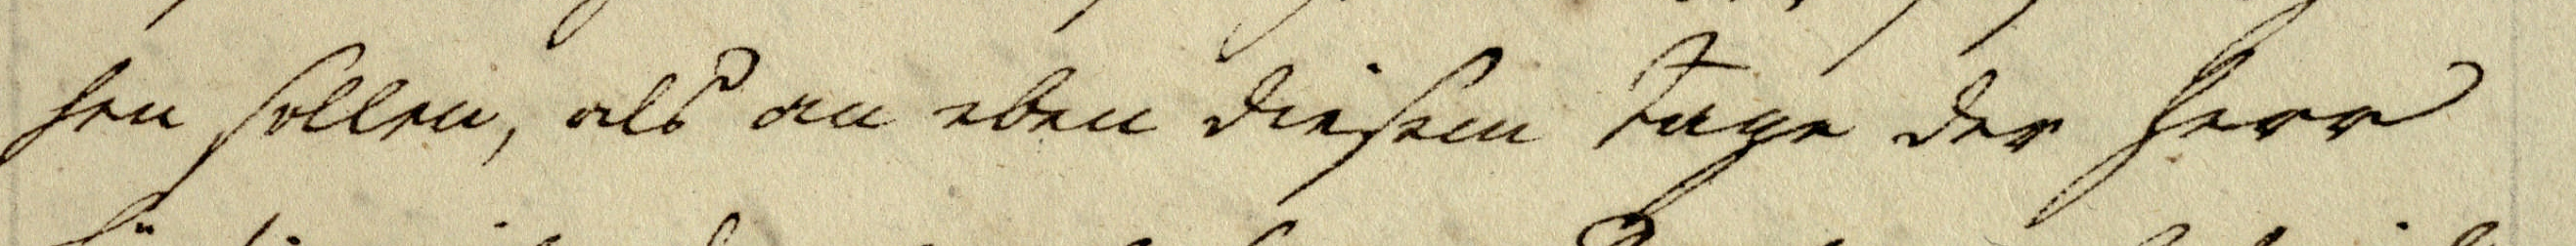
hen sollen, als an eben diesem Tage der Herr
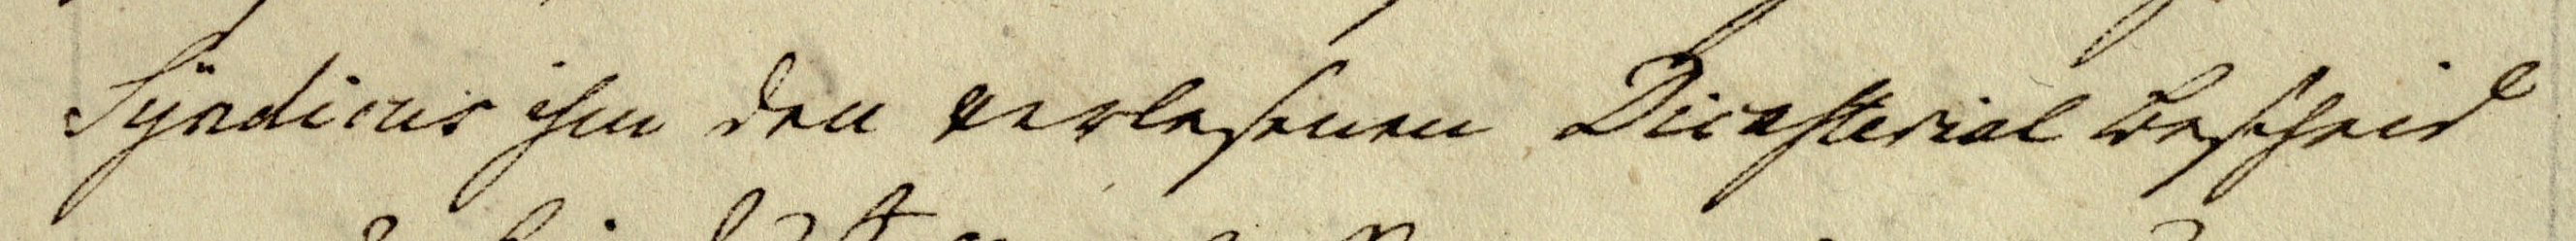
Sÿndicus ihm den verlesenen Dicasterial Bescheid
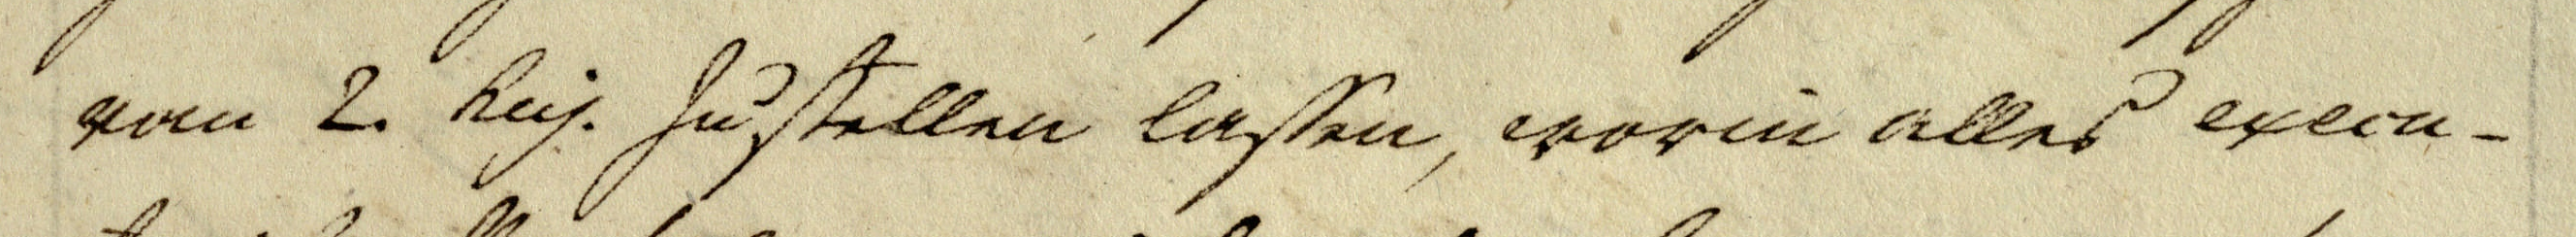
vom 2. huj. zu stellen lassen, worin alles execu¬
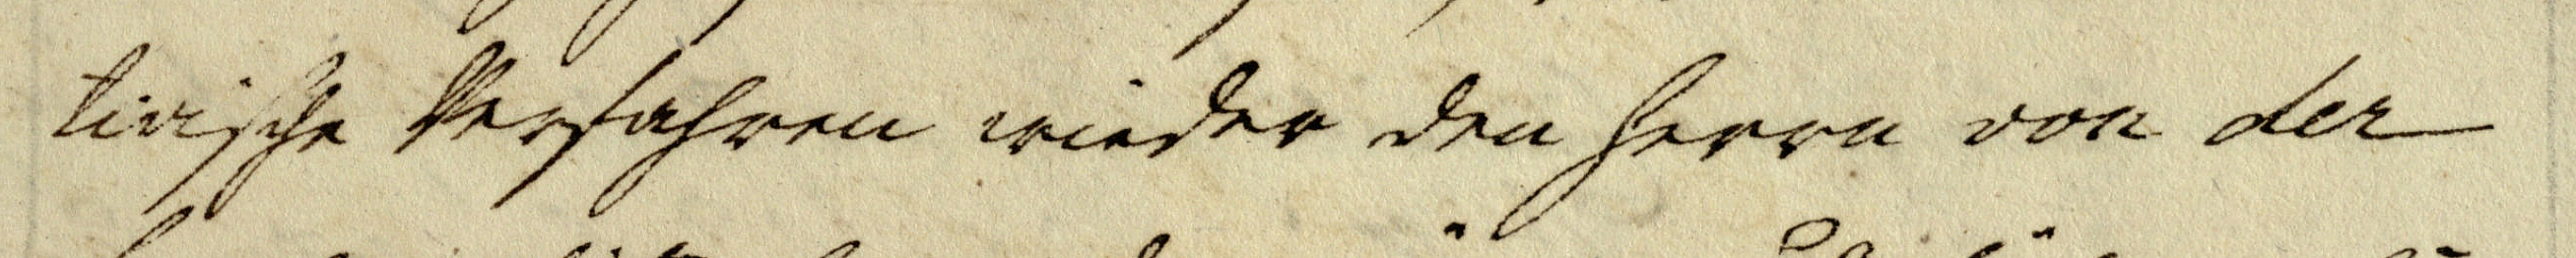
torische Verfahren wieder den Herrn von der
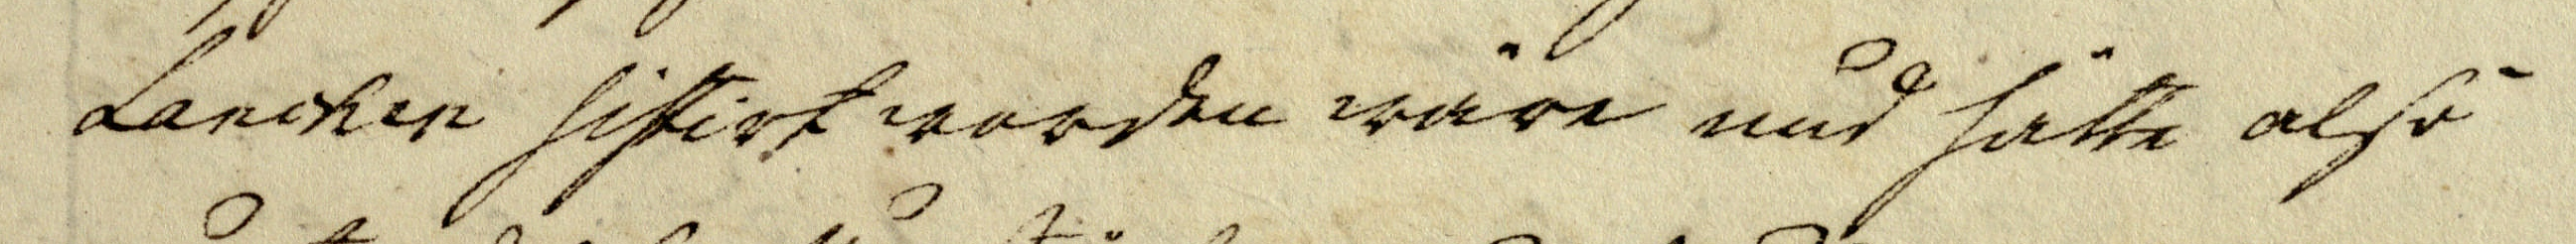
Lancken sistirt worden wäre und hätte also
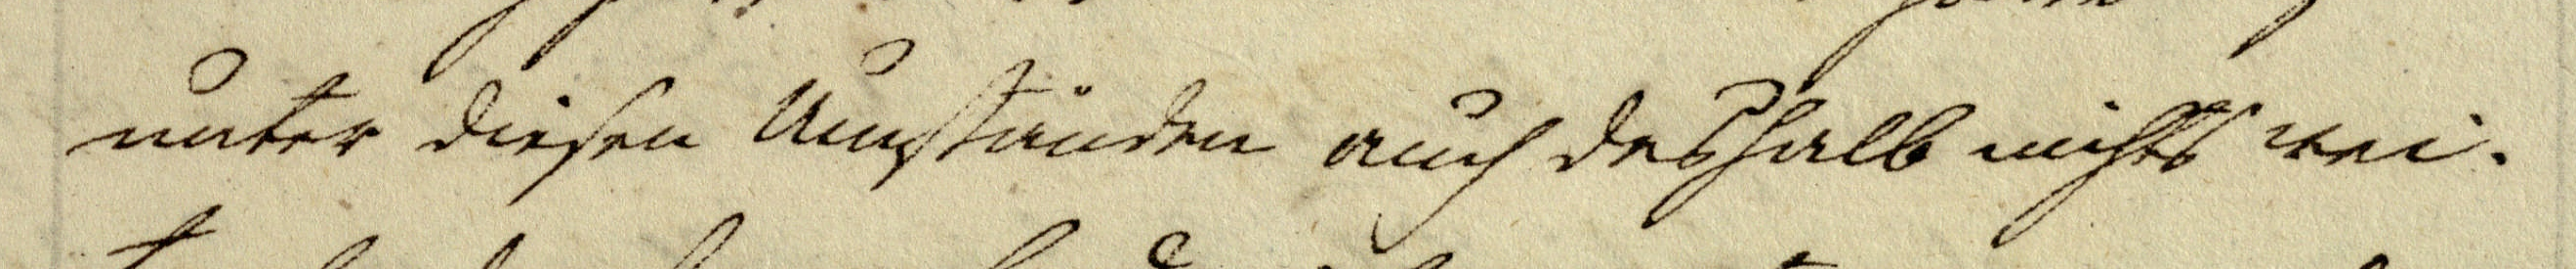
unter diesen Umständen auch deshalb nichts wei¬
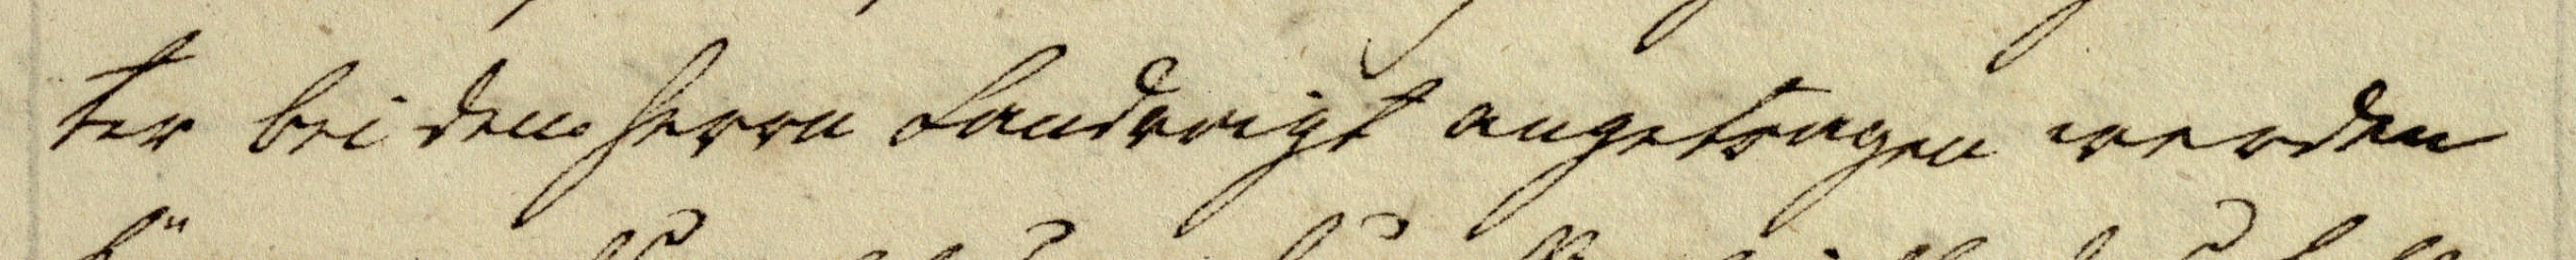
ter bei dem Herrn Landvoigt angetragen werden
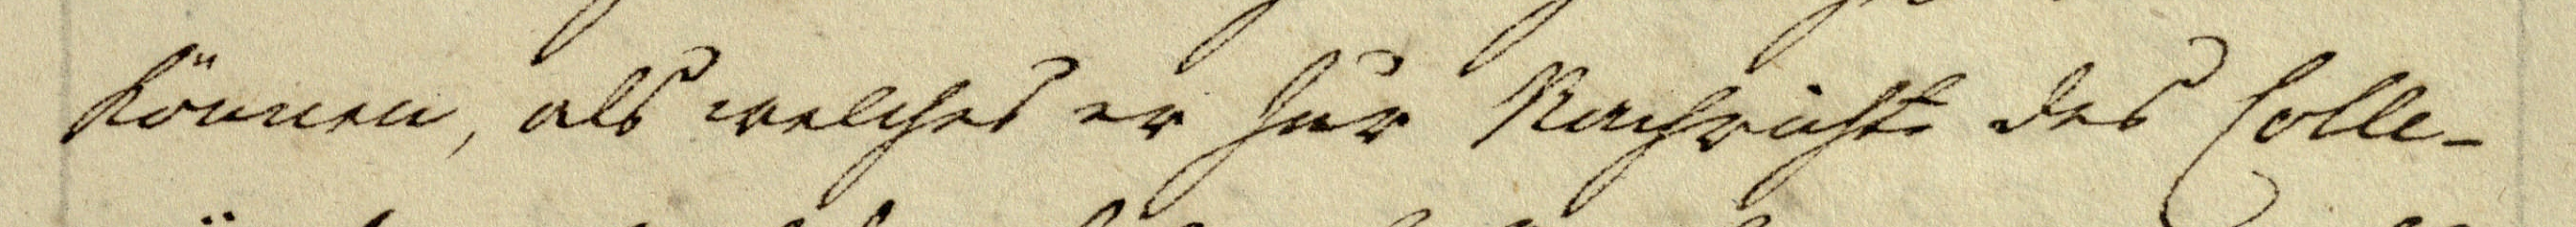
können, als welches er zur Nachricht des Colle¬
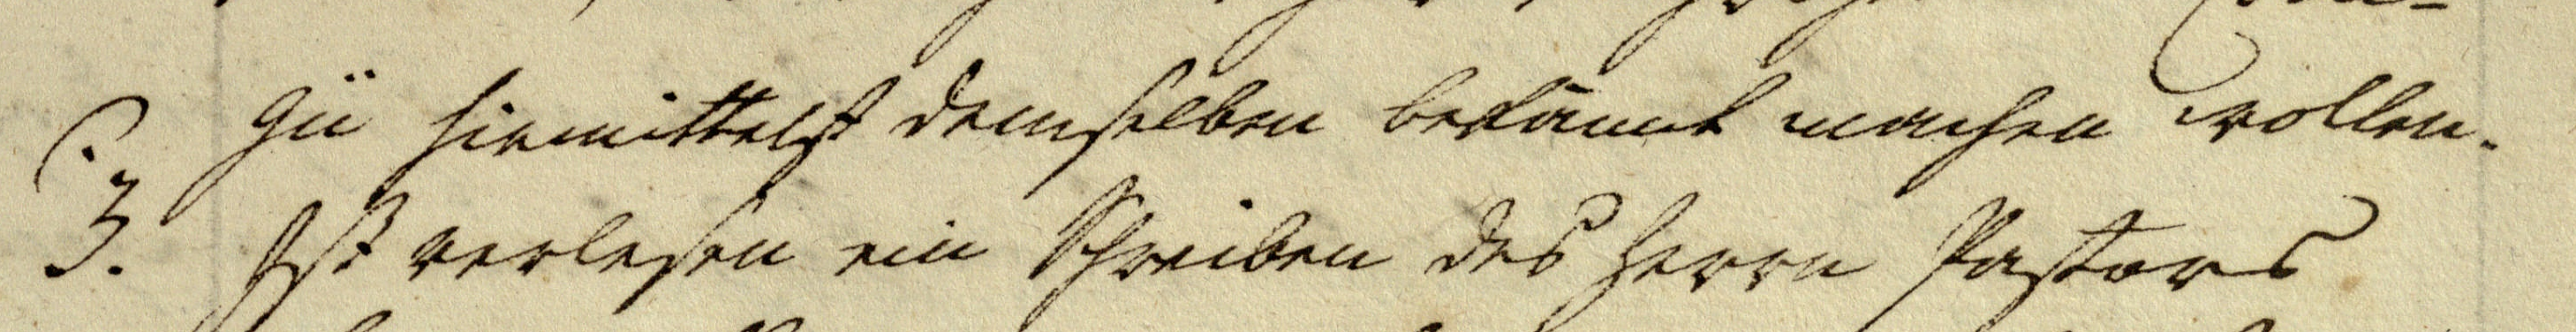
gii hiemittelst demselben bekannt machen wollen.
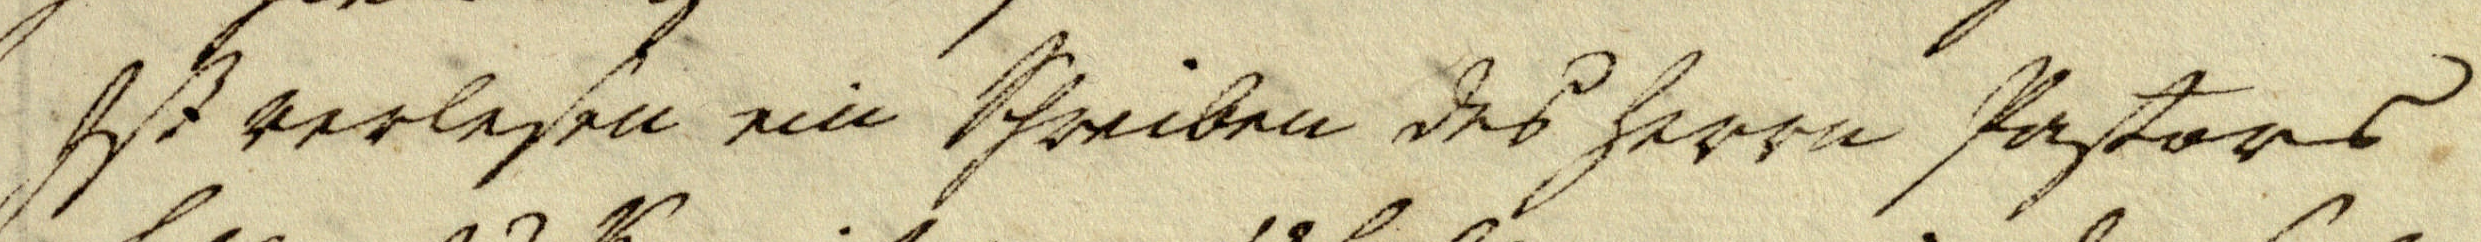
Ist verlesen ein Schreiben des Herrn Pastors
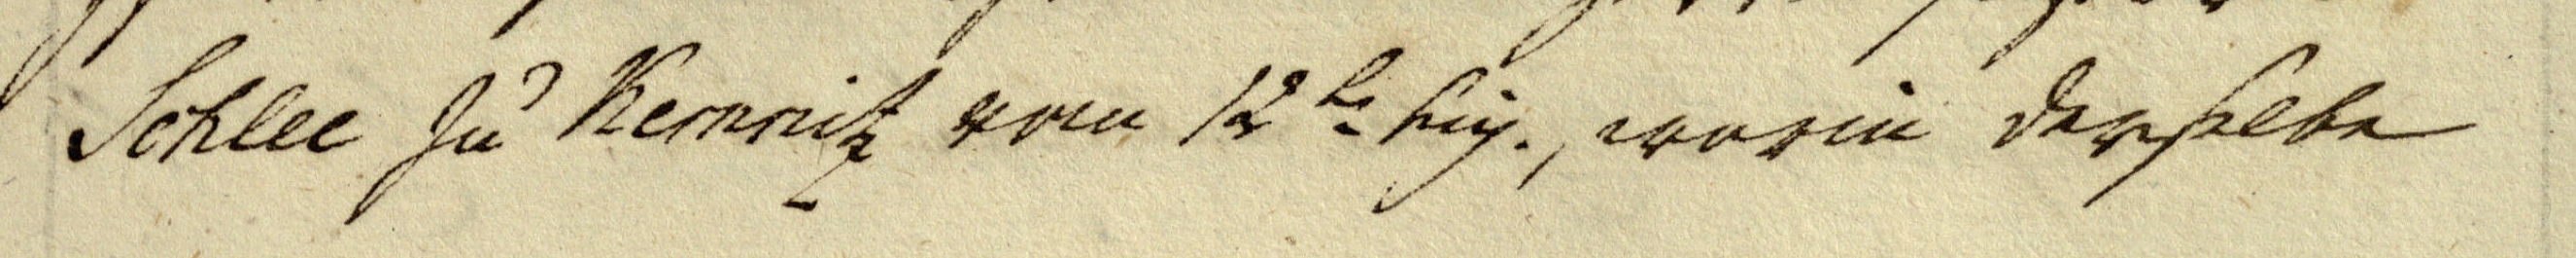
Schlee zu Kemnitz vom 12 te huj., worin derselbe
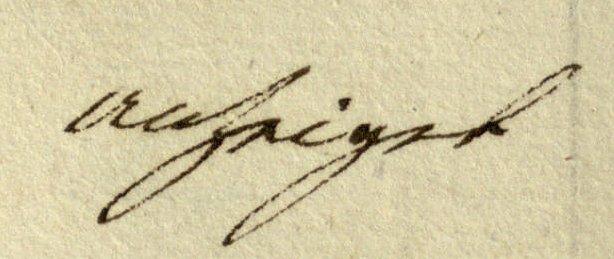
anzeiget
